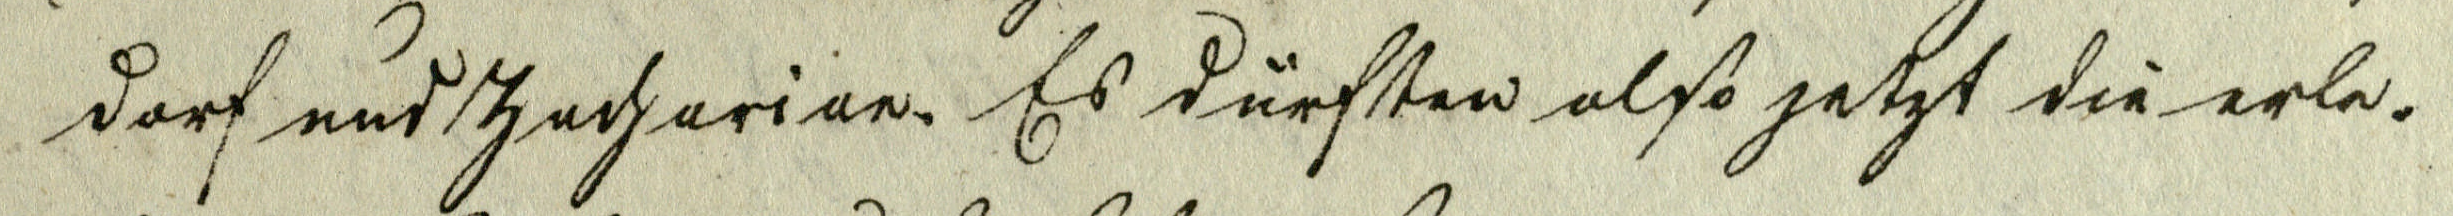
dorf und Zachariae. Es dürften also jetzt die erle¬
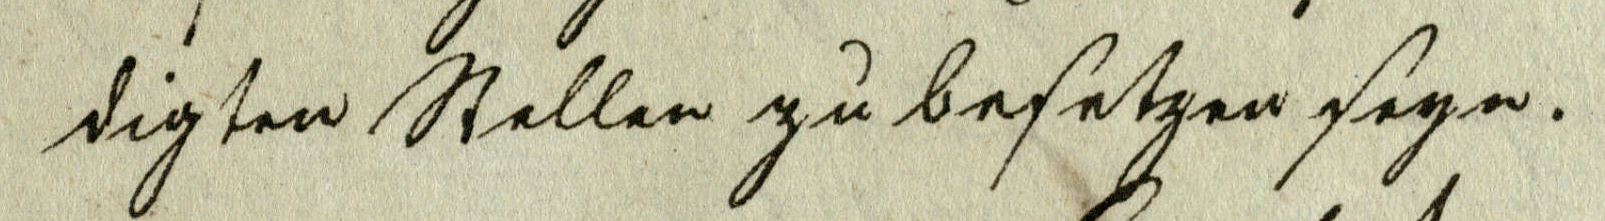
digten Stellen zu besetzen seyn.
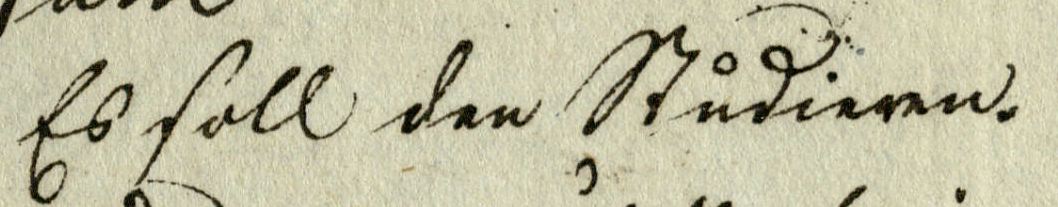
Es soll den Studieren¬
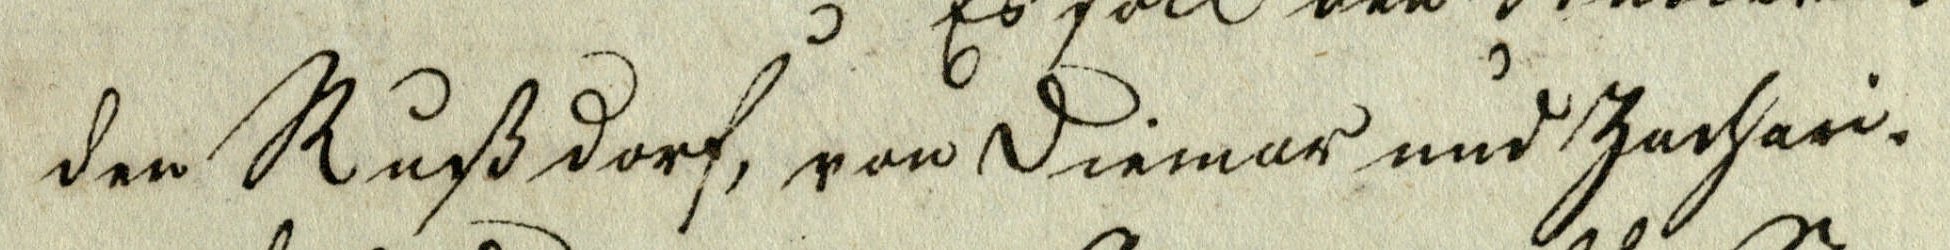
den Rußdorf, von Diemar und Zachari¬
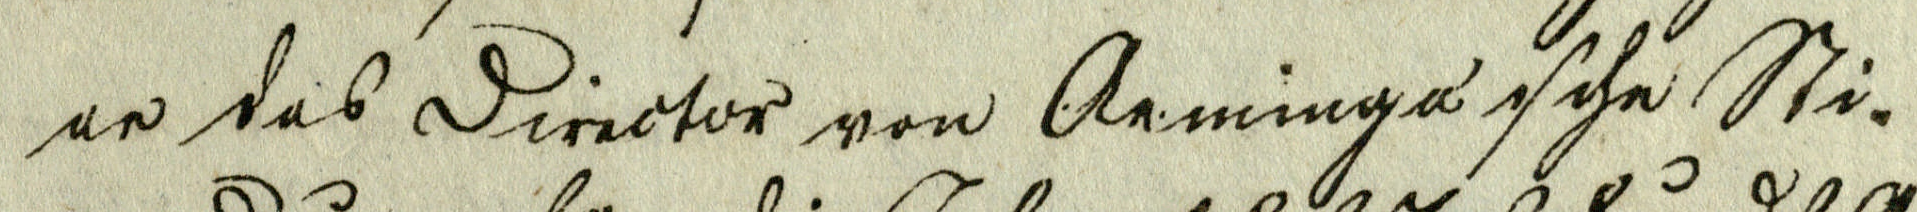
ae das Director von Aeminga'sche Sti¬
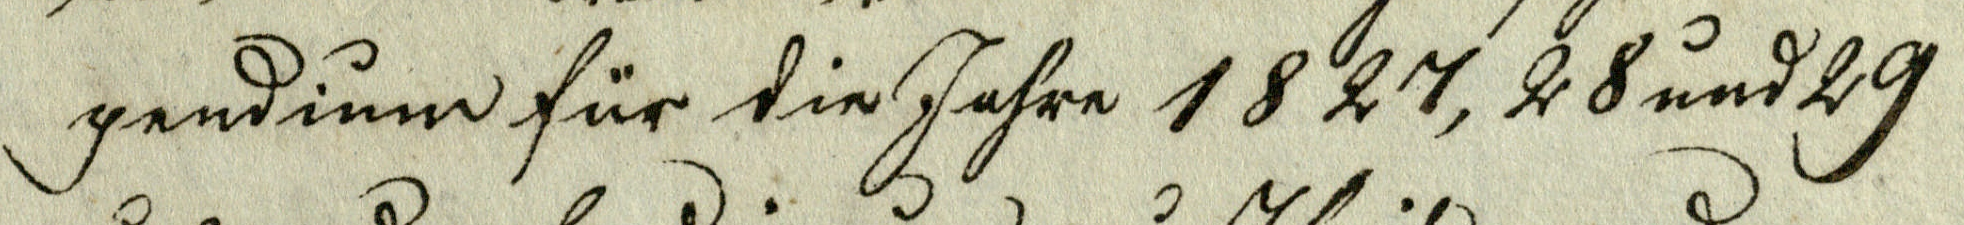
pendium für die Jahre 1827, 28 und 29
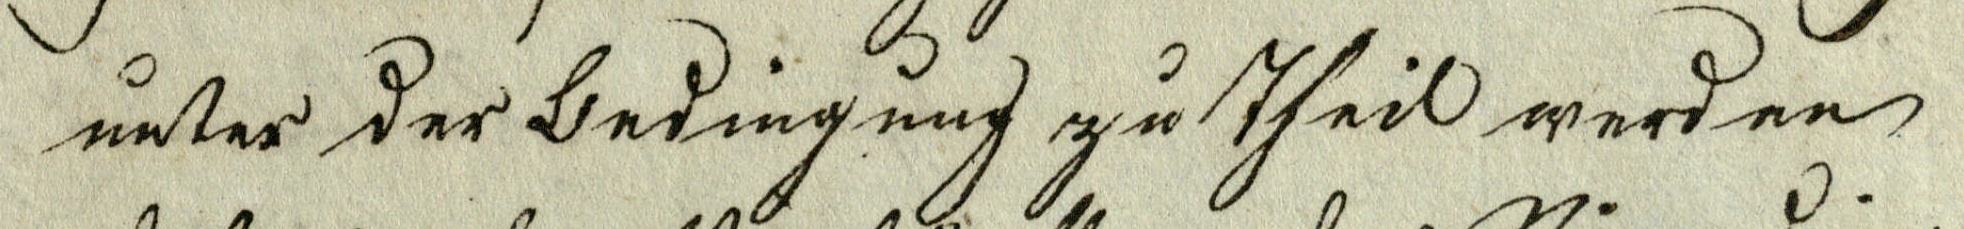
unter der Bedingung zu Theil werden,
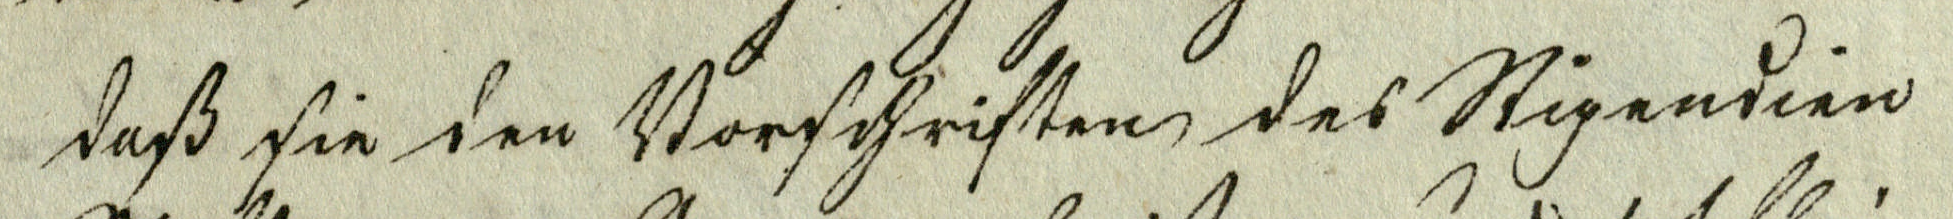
daß sie den Vorschriften des Stipendien
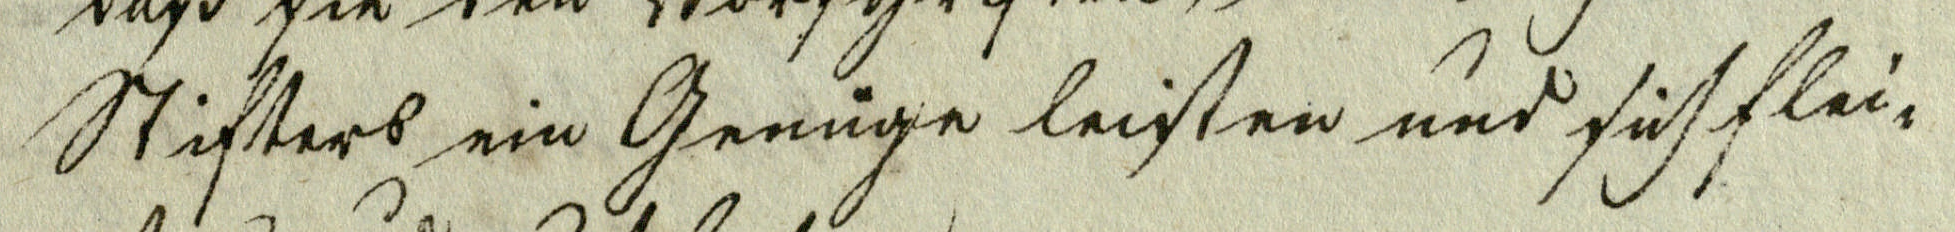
Stifters ein Genüge leisten und isch flei¬
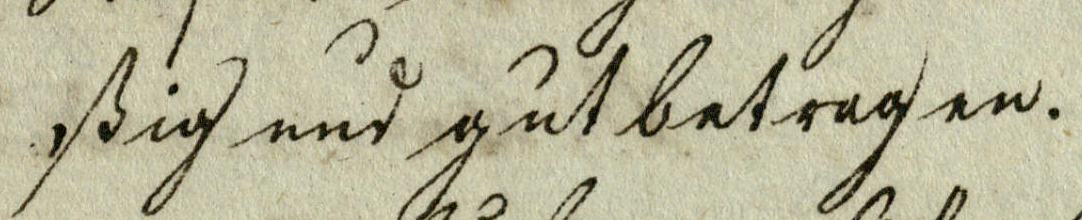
ßig und gut betragen.
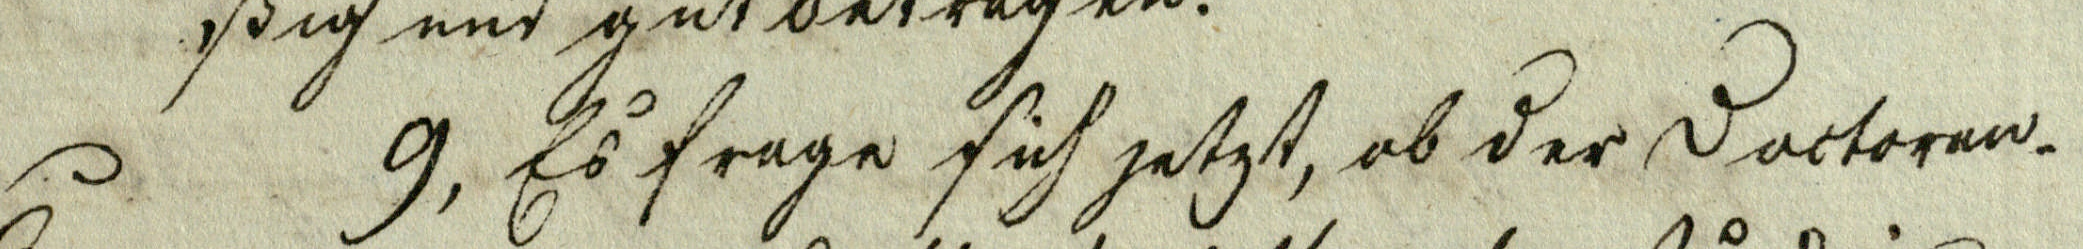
9, es frage sich jetzt, ob der Doctoran¬
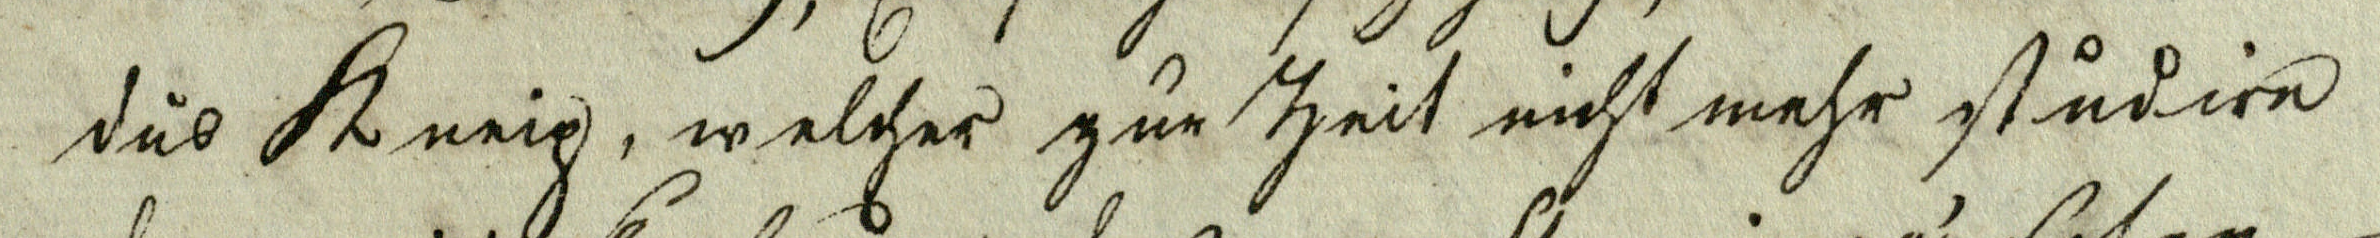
dus Kneip, welcher zur Zeit nicht mehr studire
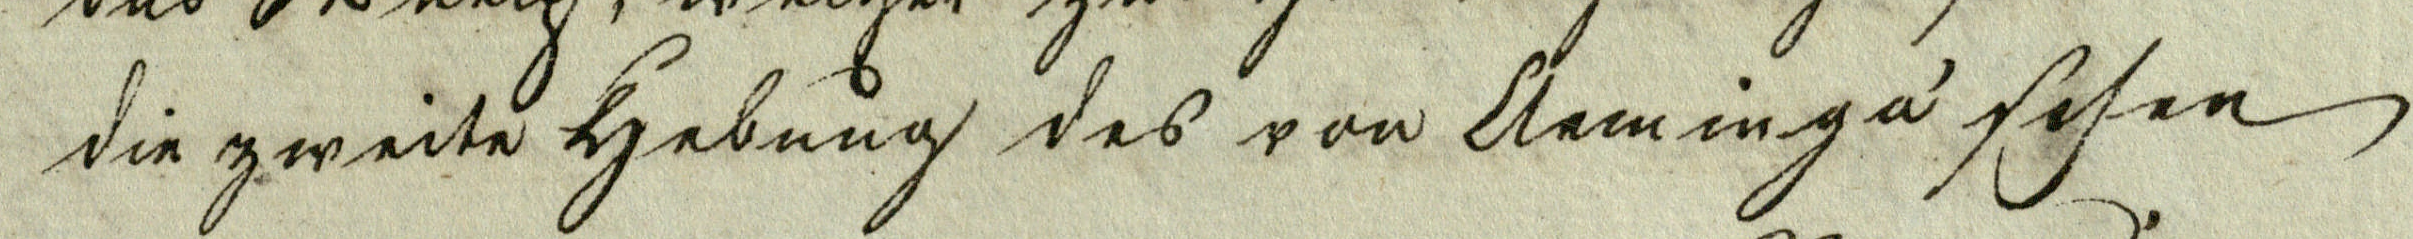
die zweite Hebung des von Aeminga'schen
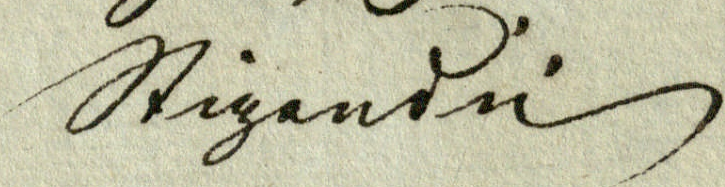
Stipendii
